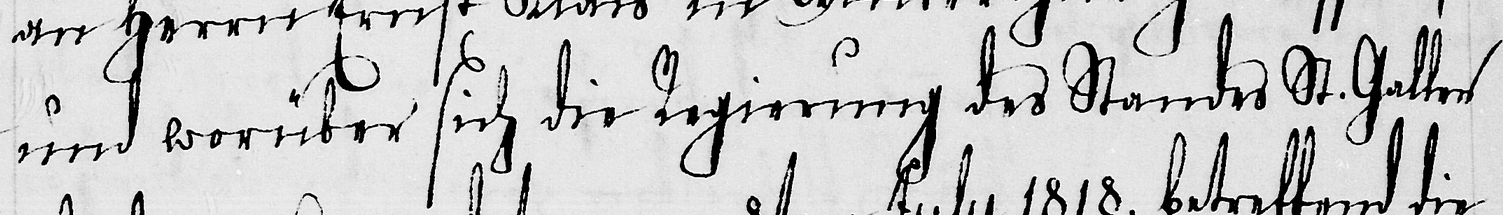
und worüber sich die Regierung des Standes St. Gallen
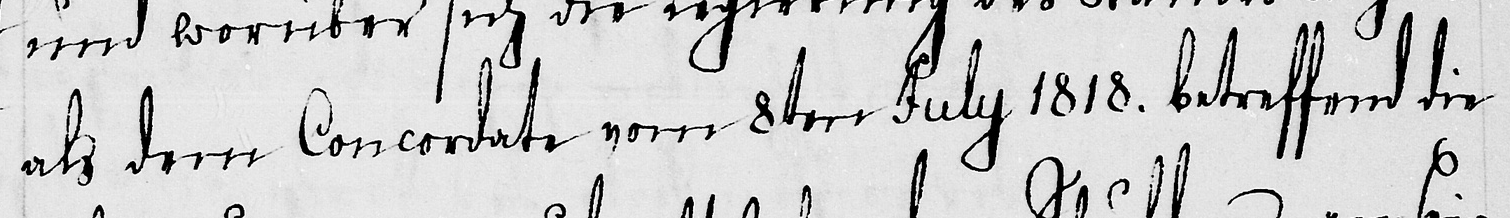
als dem Concordate vom 8ten July 1818. betreffend die
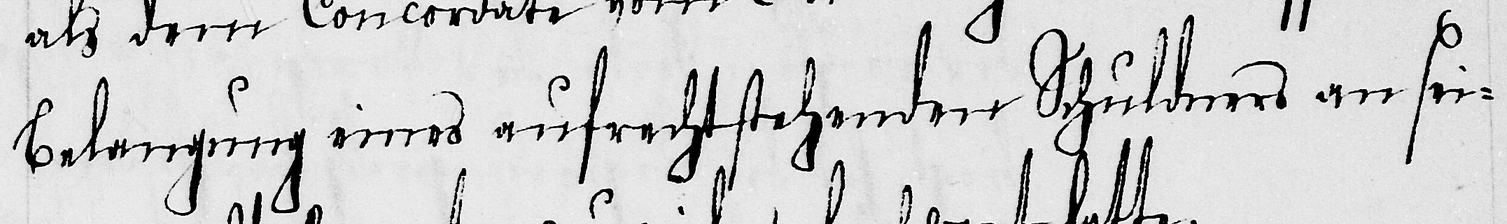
Belangung eines aufrechtstehenden Schuldners an sei¬
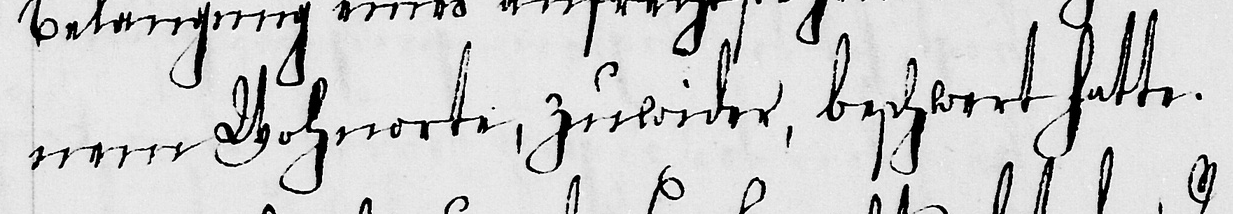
nem Wohnorte, zuwider, beschwert hatte.
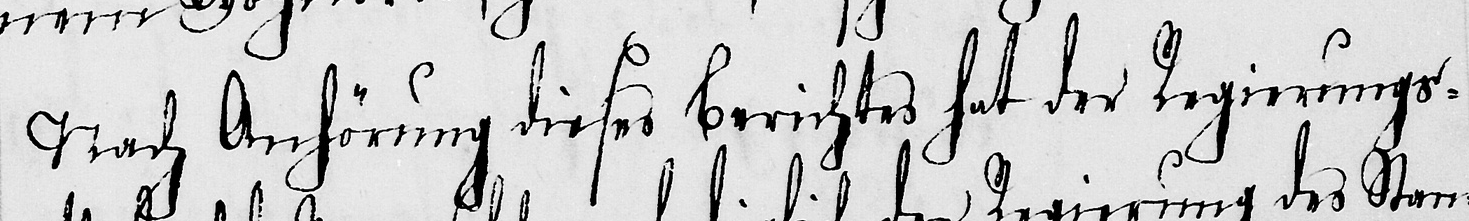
Nach Anhörung dieses Berichtes hat der Regierungs¬
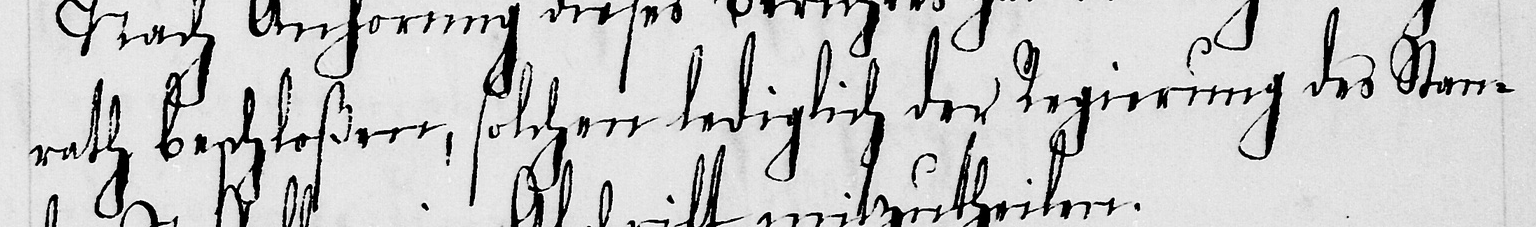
rath beschloßen, solchen lediglich der Regierung des Stan¬
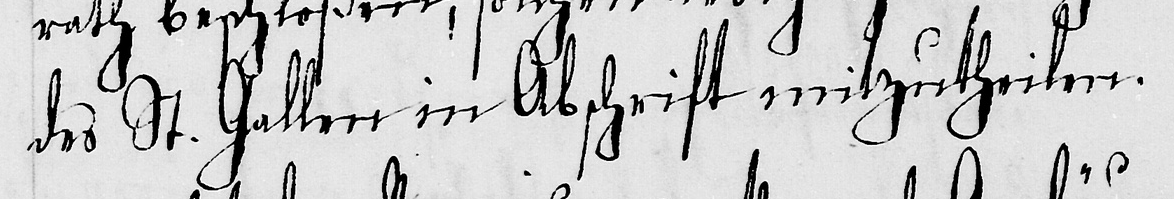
des St. Gallen in Abschrift mitzutheilen.
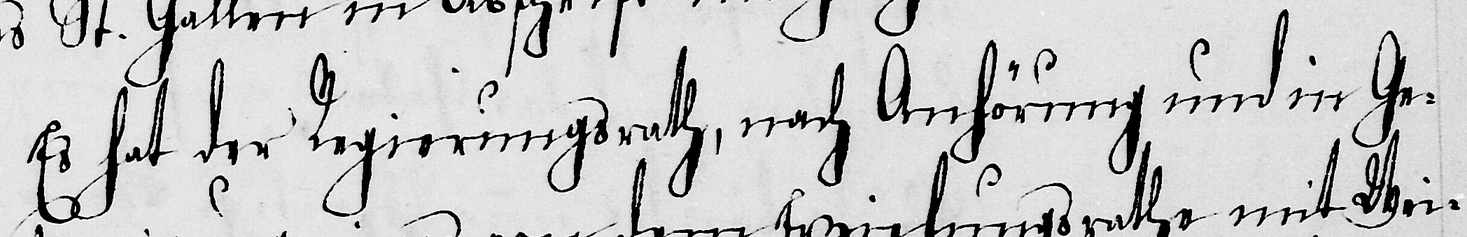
Es hat der Regierungsrath, nach Anhörung und in Ge¬
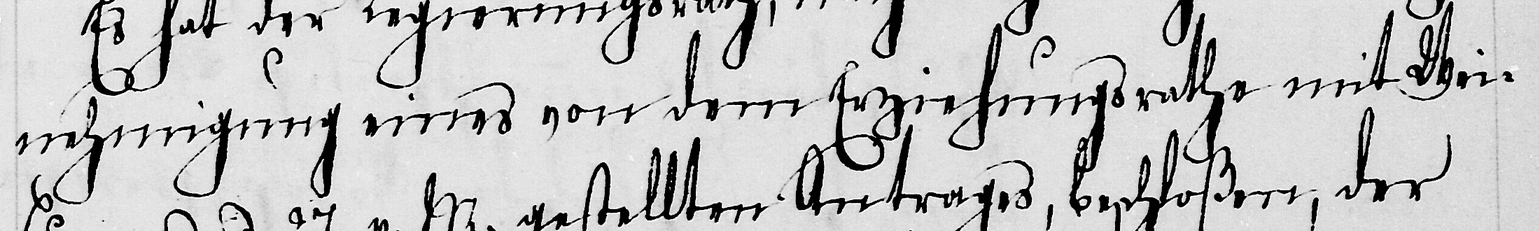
nehmigung eines von dem Erziehungsrathe mit Wei¬
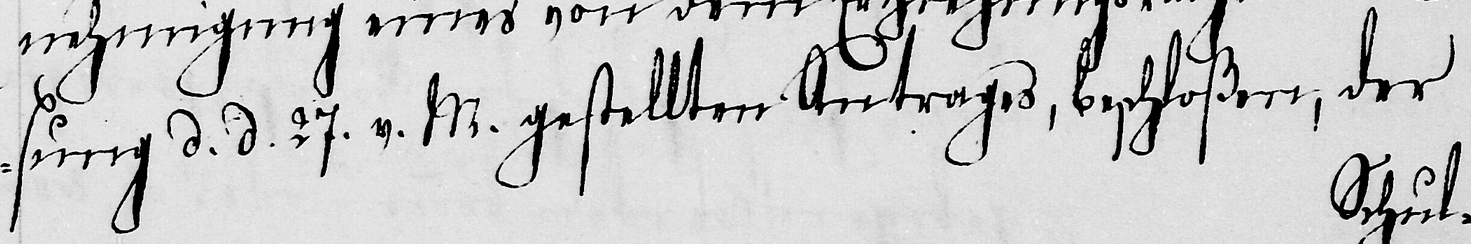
sung d. d. 27. v. M. gestellten Antrages, beschloßen, der
